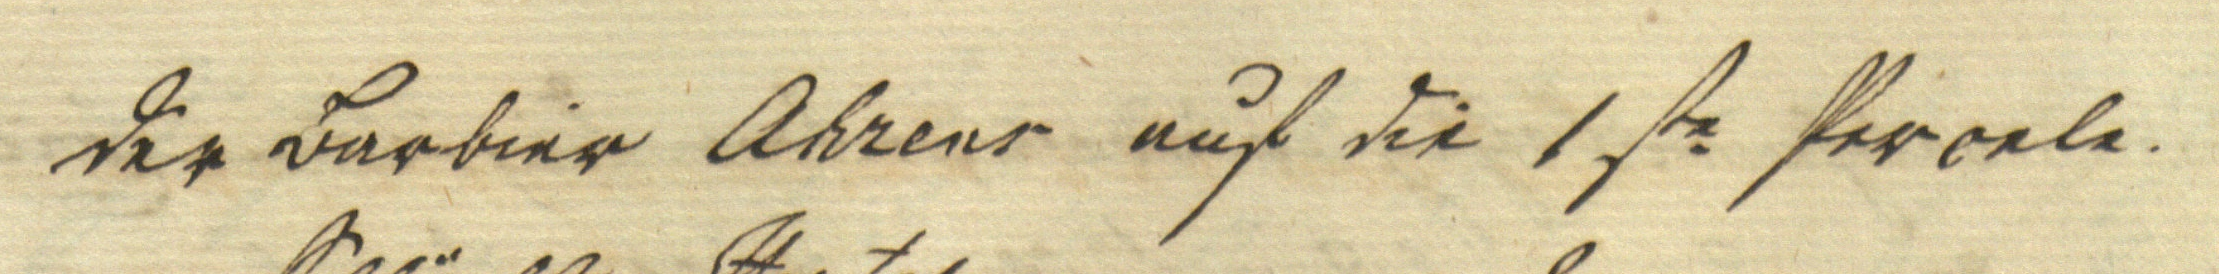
der Barbier Ahrens auf die 1 ste. Percele.
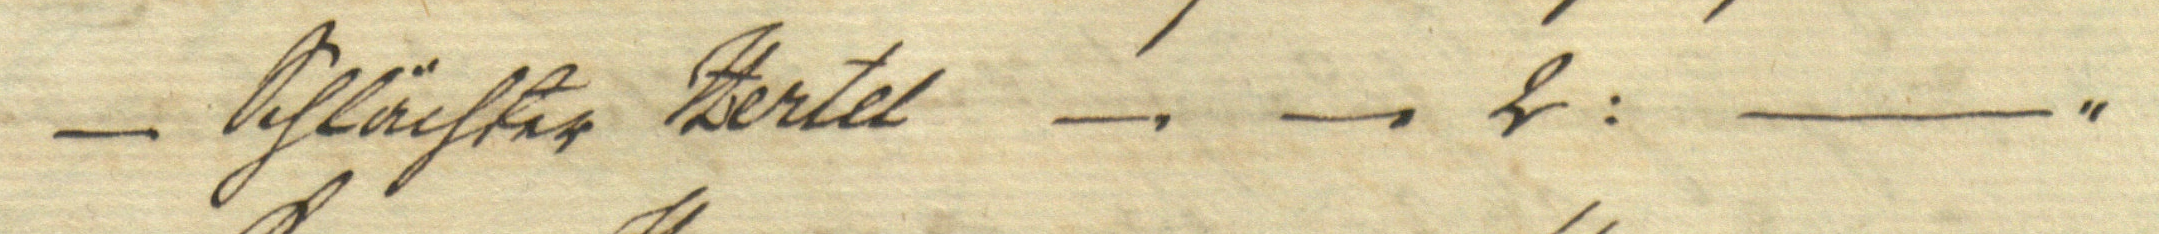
Schlächter Hertel 2:
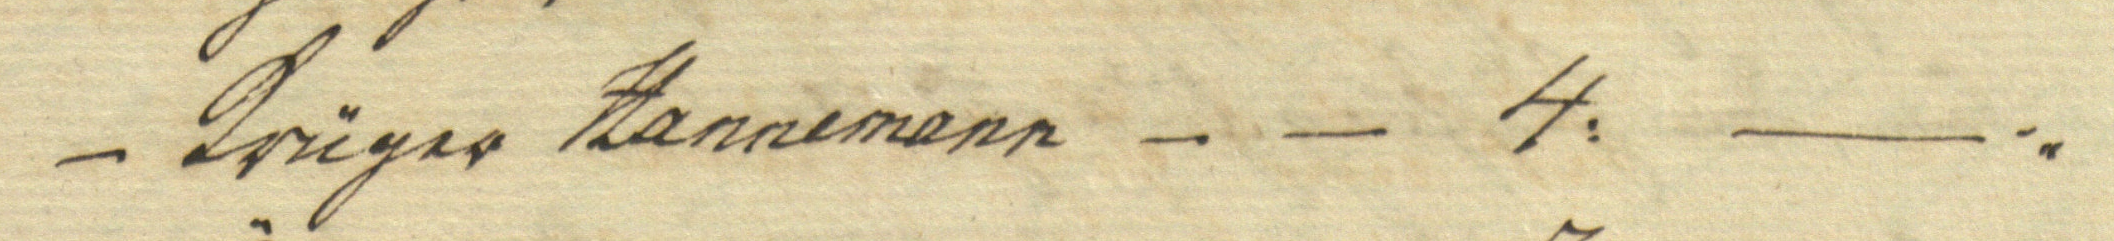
Krüger Hannemann 4:
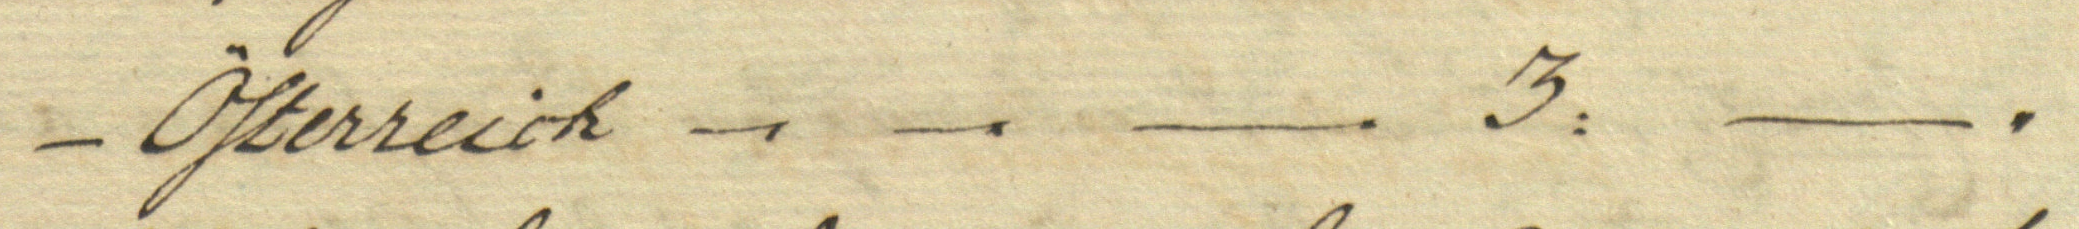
Österreich 3:
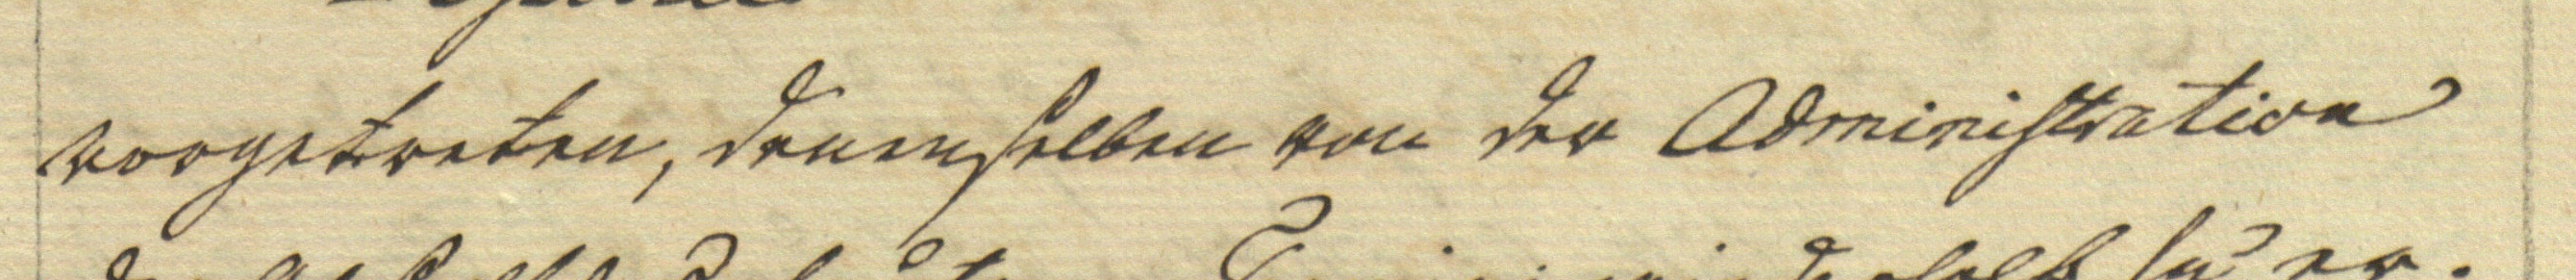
vorgetreten, denselben von der Administration
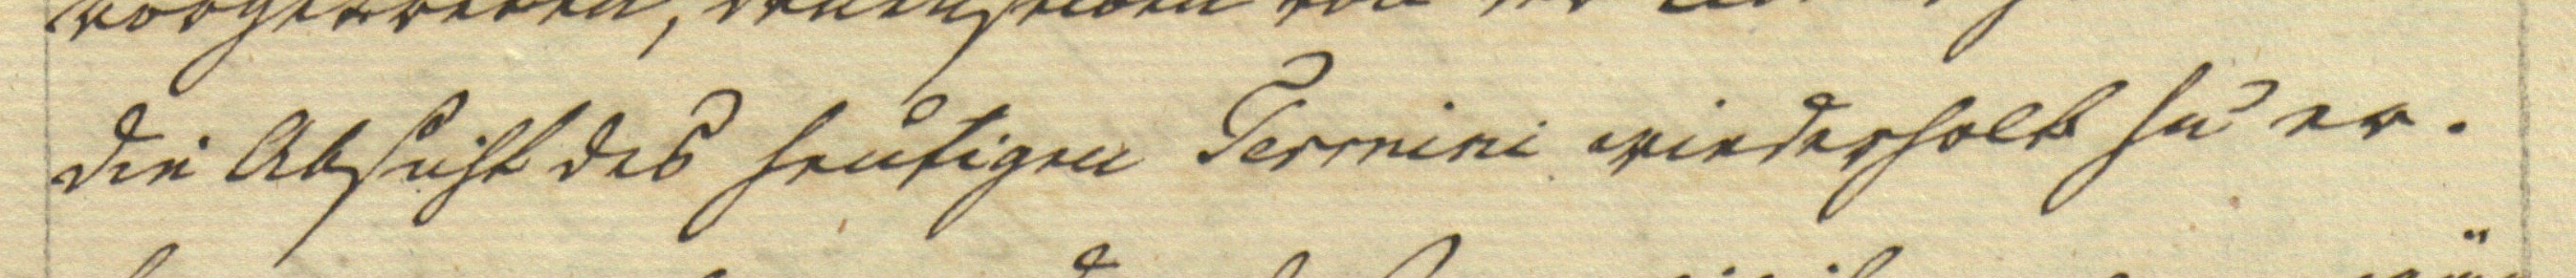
die Absicht des heutigen Termini wiederholt zu er¬
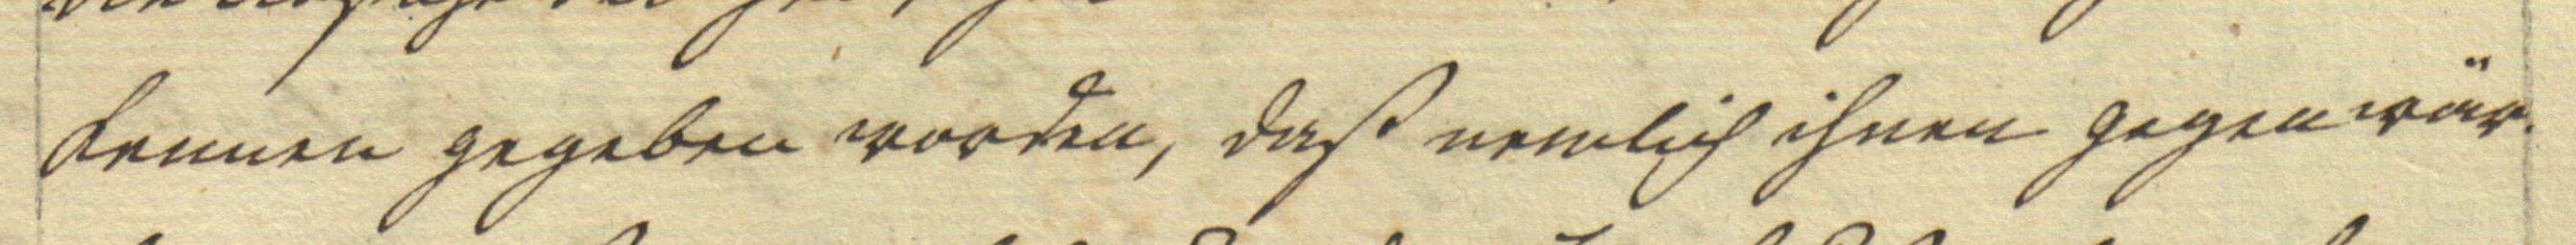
kennen gegeben worden, daß nemlich ihnen gegenwär¬
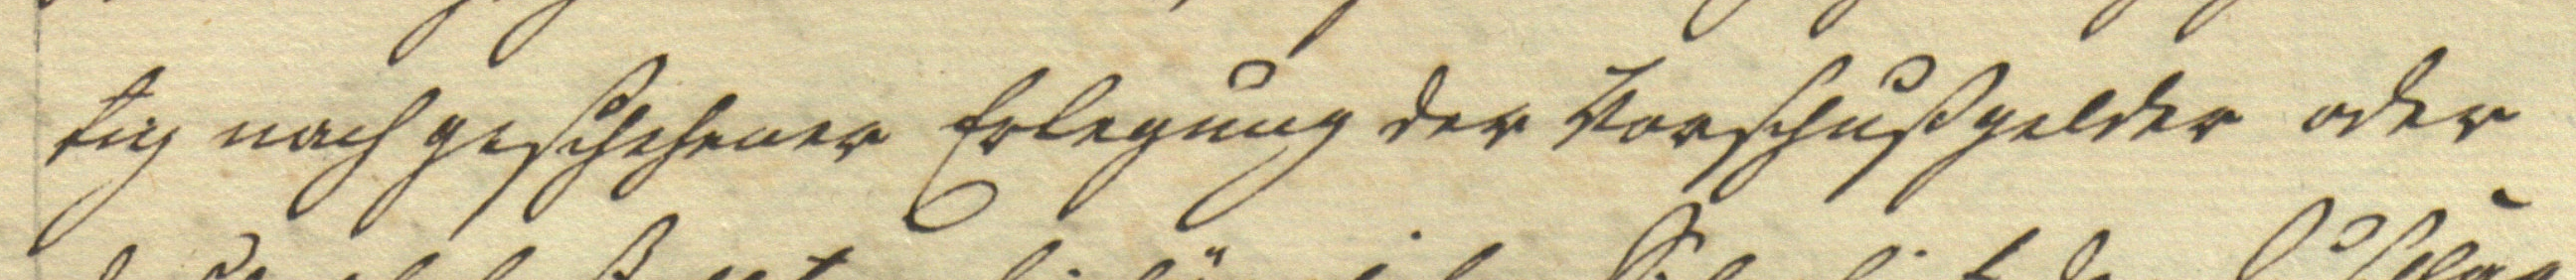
tig nach geschehener Erlegung der Vorschußgelder oder
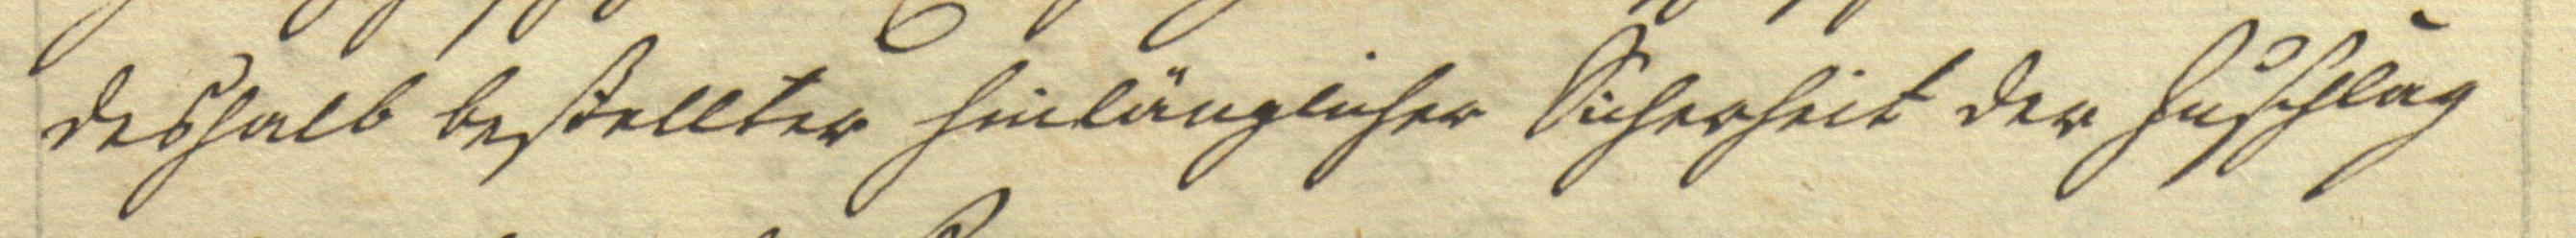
deshalb bestellter hinlänglicher Sicherheit der Zuschlag
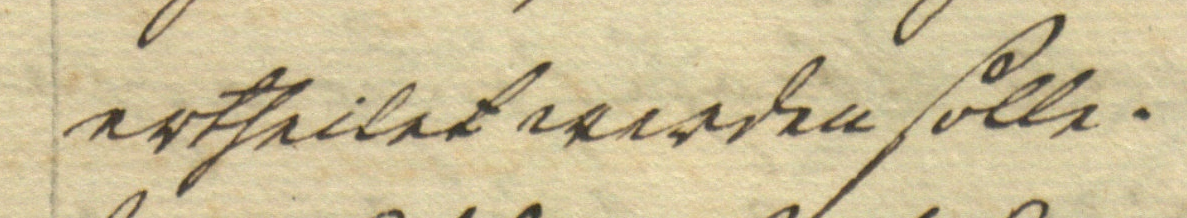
ertheilet werden solle.
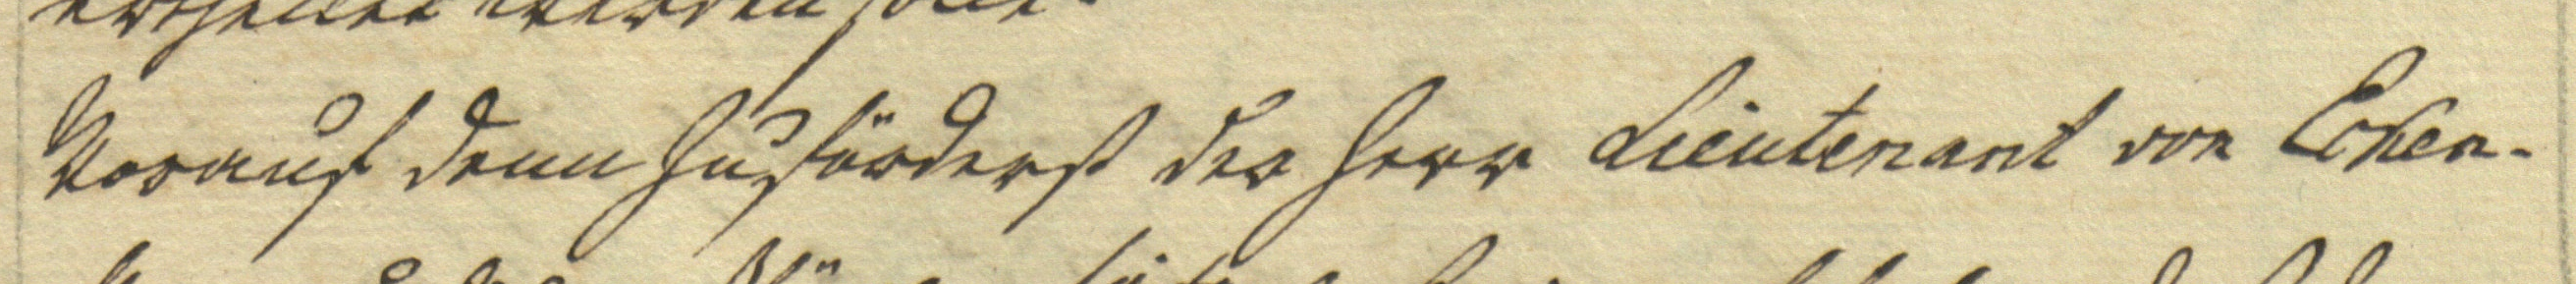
Worauf denn zuförderst der Herr Lieutenant von Ecken¬
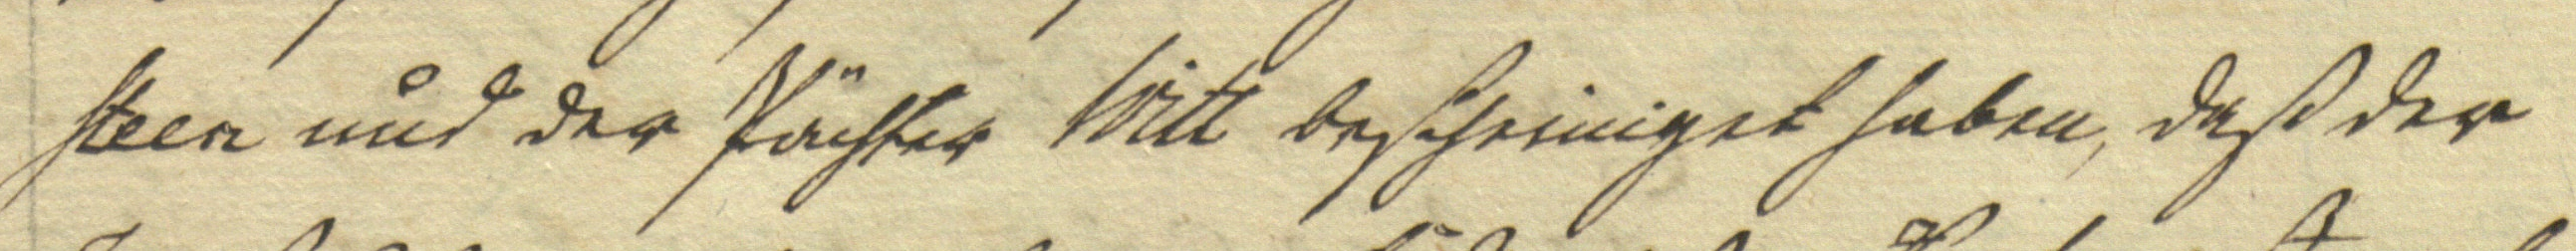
steen und der Pächter Witt bescheiniget haben, daß der
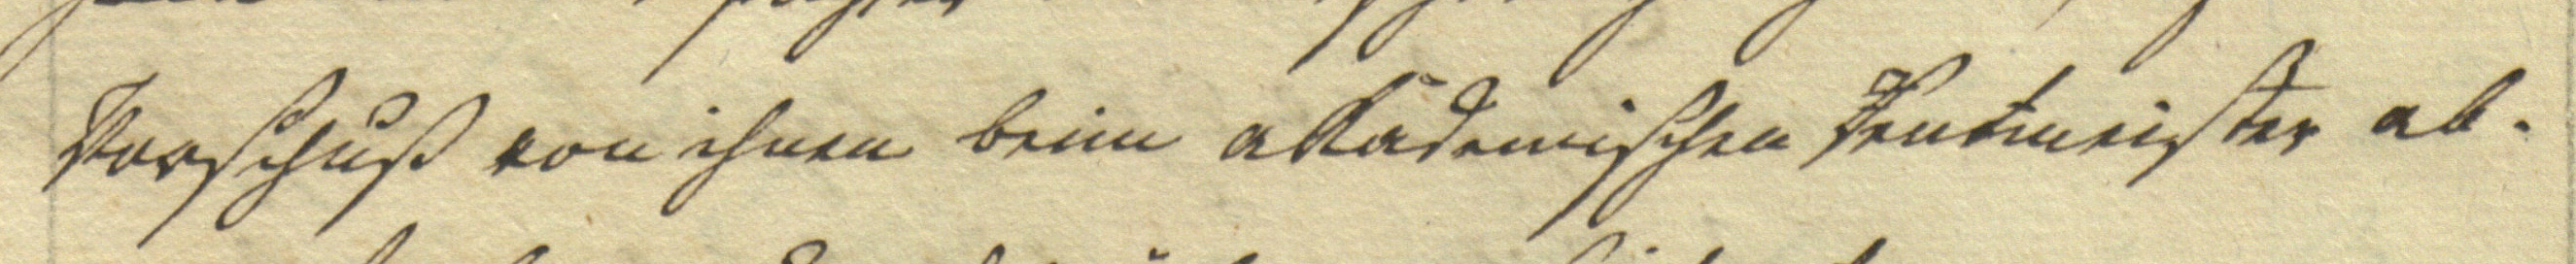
Vorschuß von ihnen beim akademischen Rentmeister ab¬
